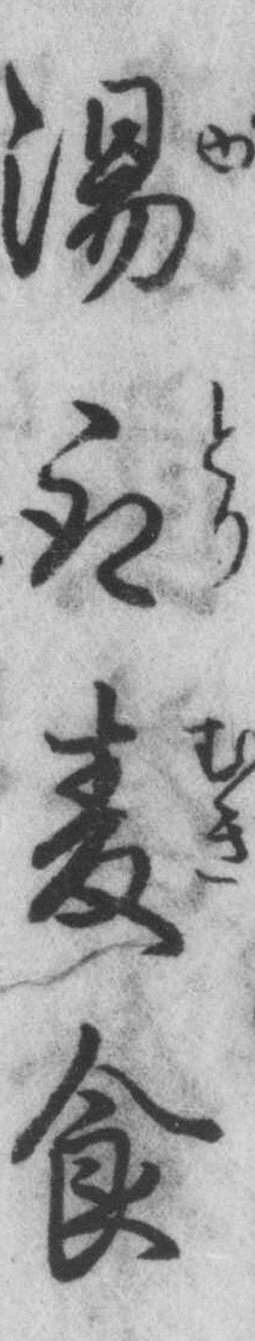湯取麦食
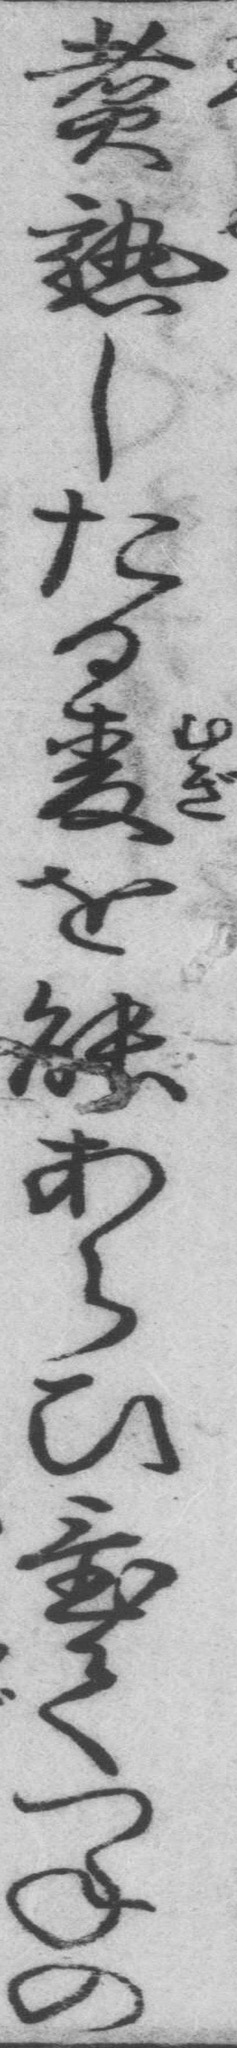煮熟したる麦を能あらひ置くつ年の
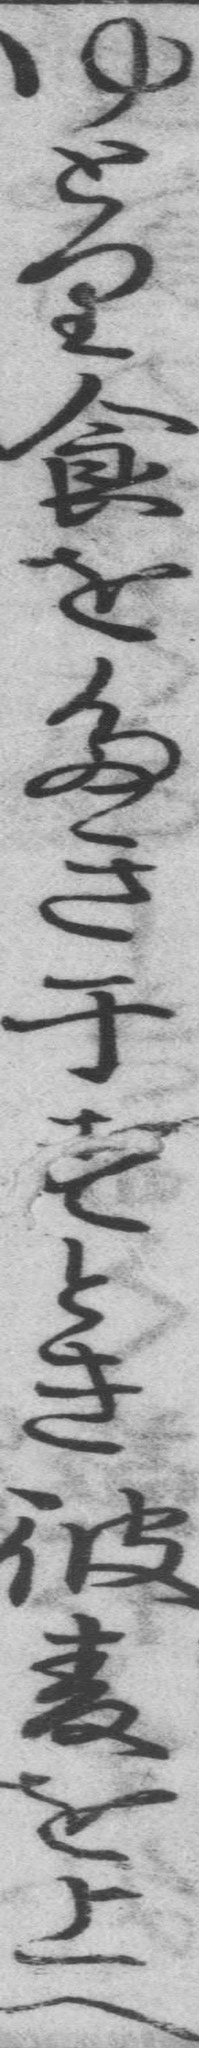ゆと里食を多き干春とき彼麦を上へ
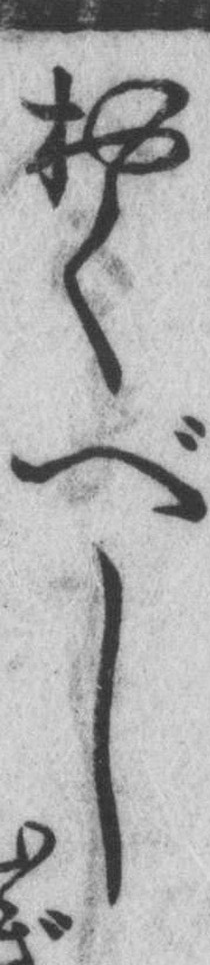おくべし
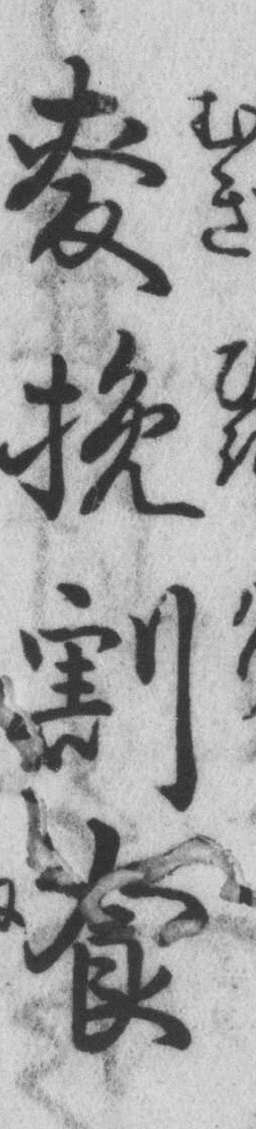麦挽割食
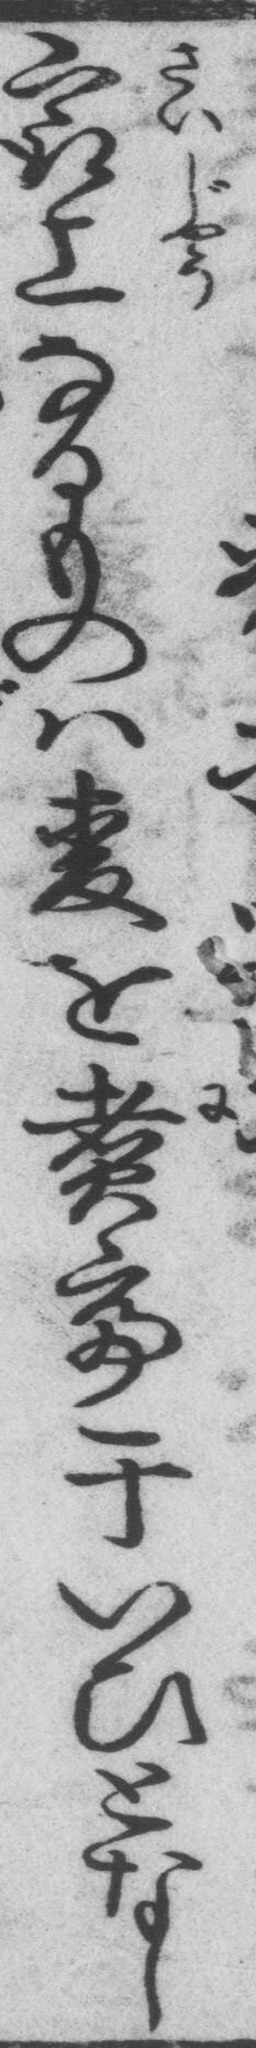最上なるものは麦を煮亭干いひとなし
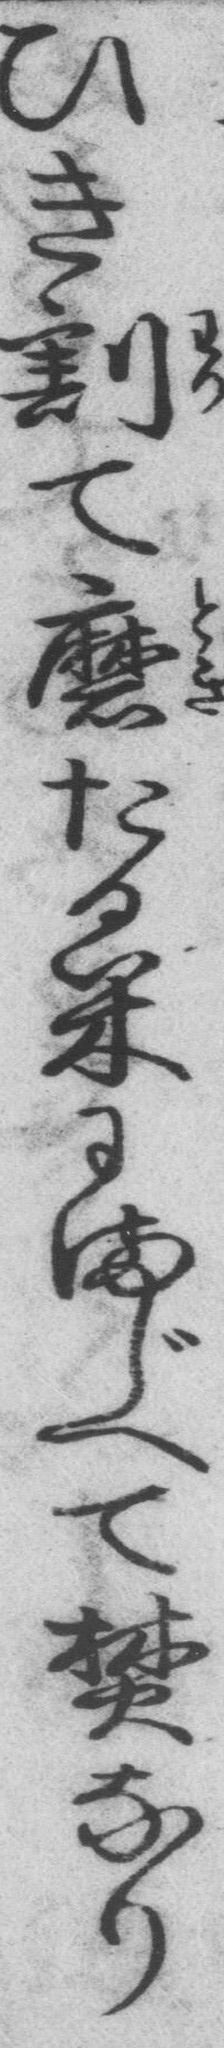ひき割て磨たる米尓満じへて焚なり
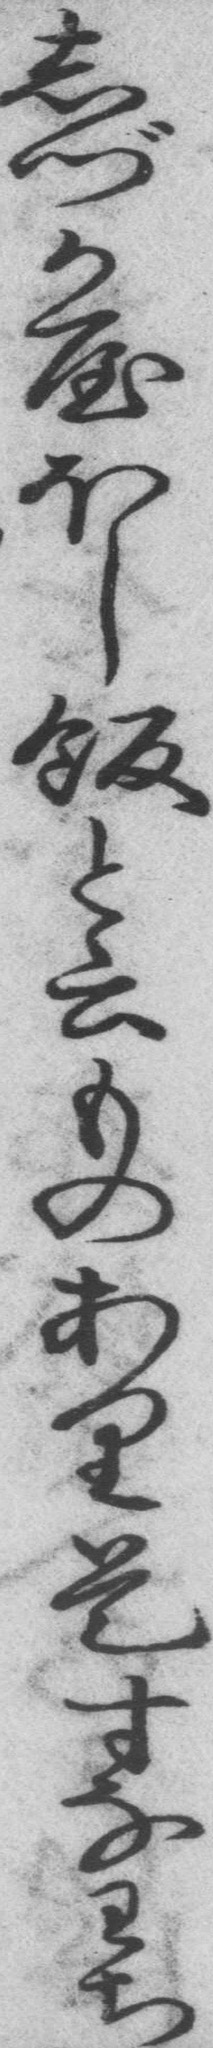志づか屋不し飯と云ものあ里是すなわち
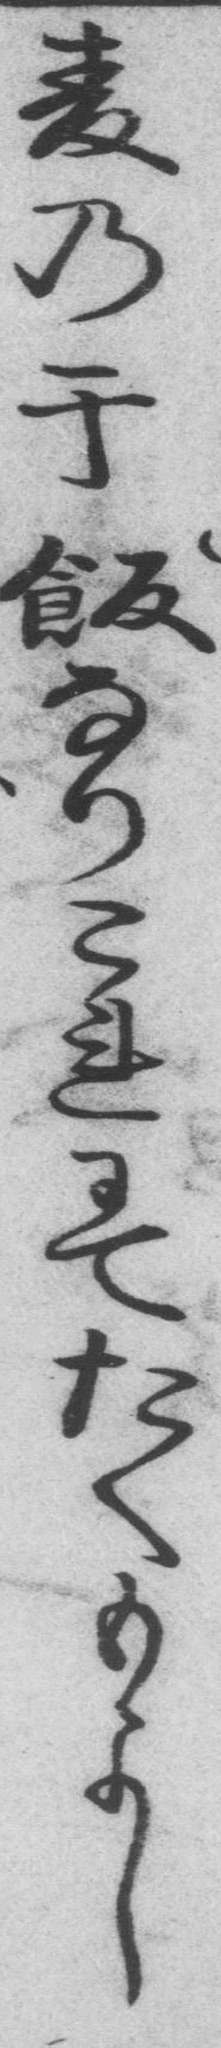麦乃干飯なりこ連尓てたくもよし
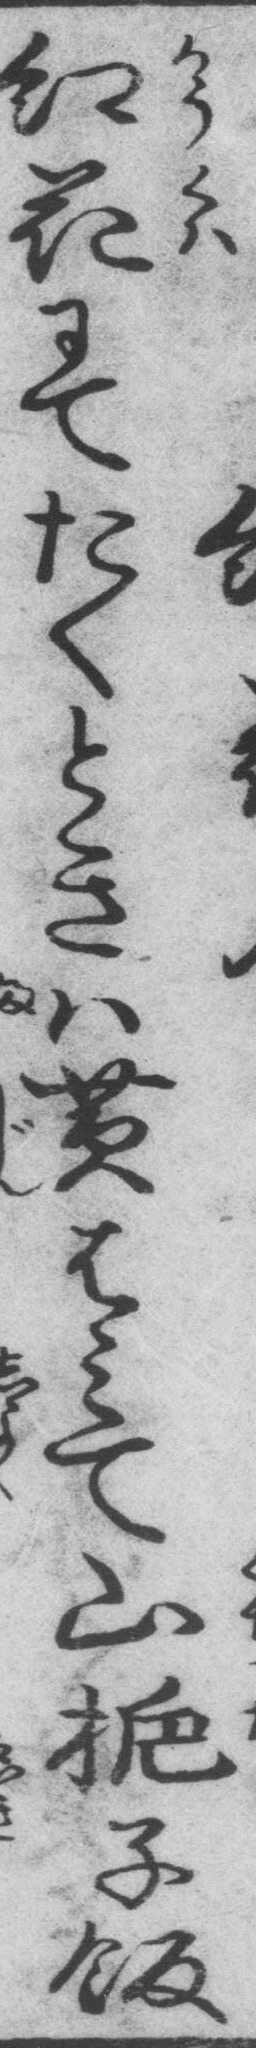紅花尓てたくときは黄はみて山梔子飯
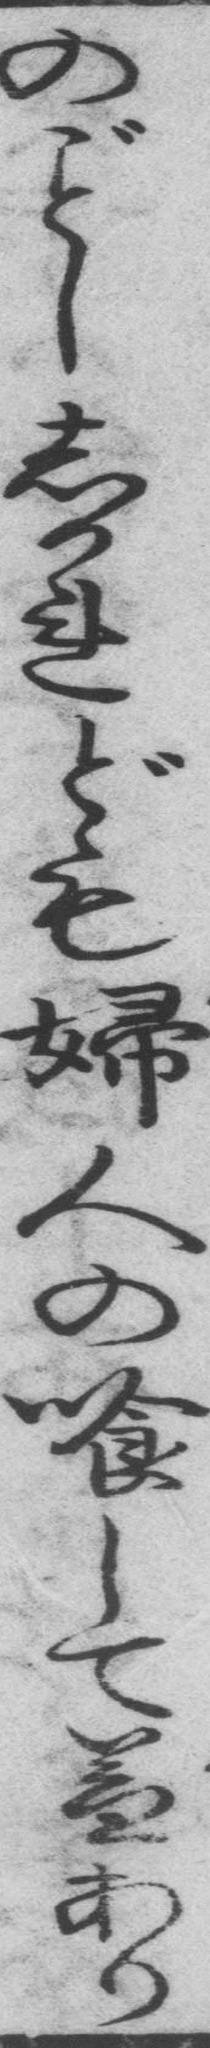のごとし志か連ども婦人の喰して益あり

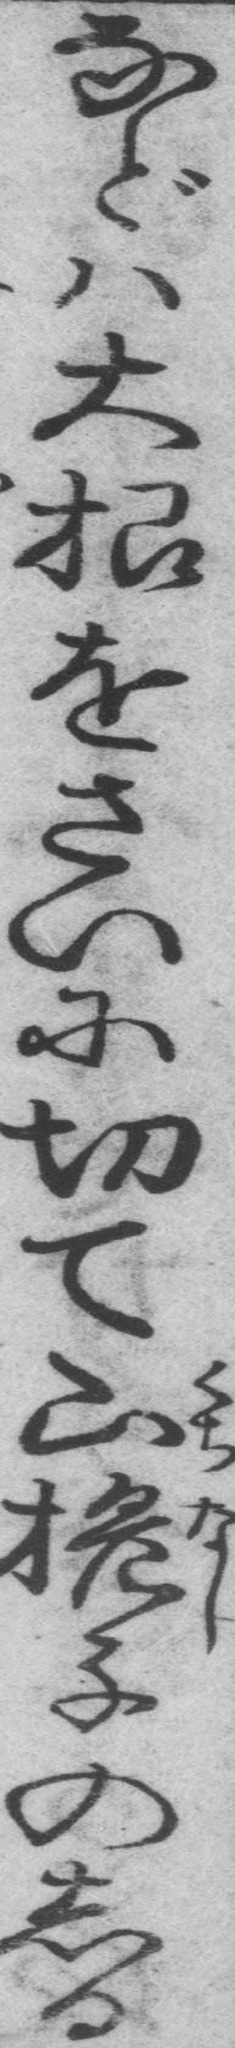などは大根をさい尓切て山梔子の志る
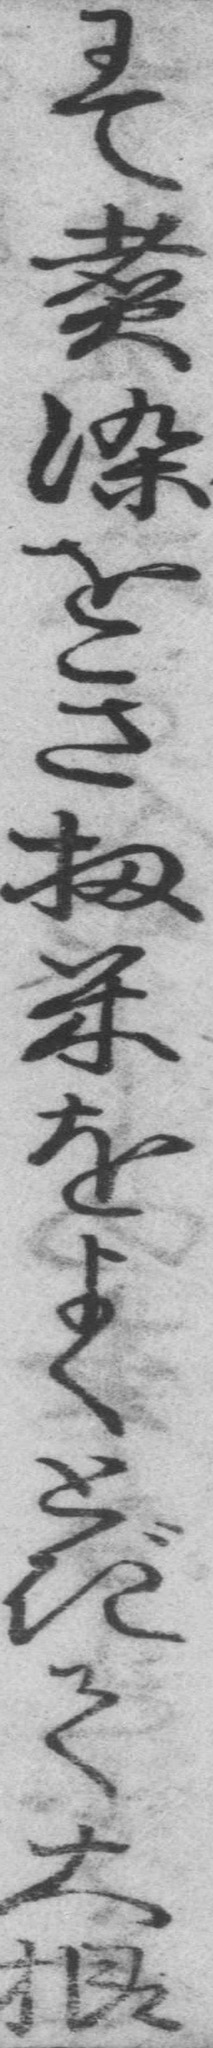尓て煮染をき扨米をよくとぎて大根
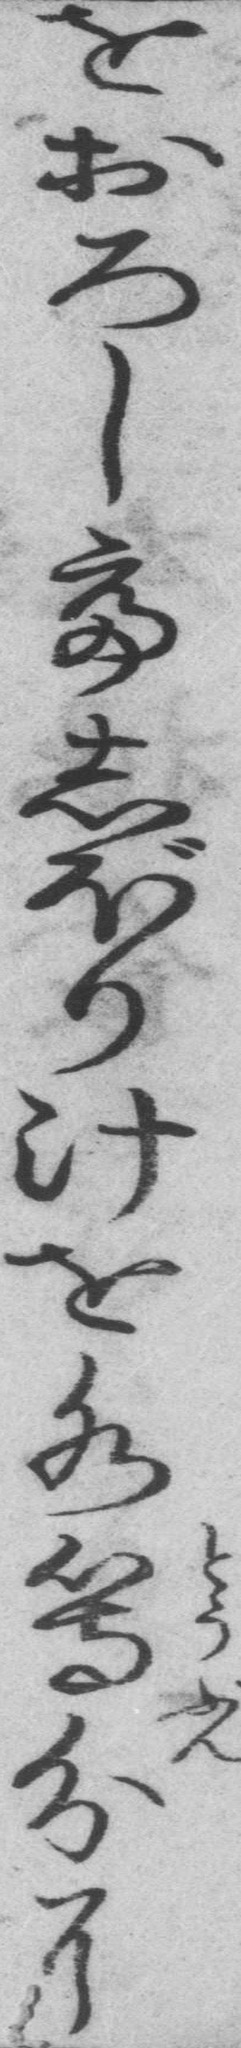をおろし亭志ぼり汁を水等分耳
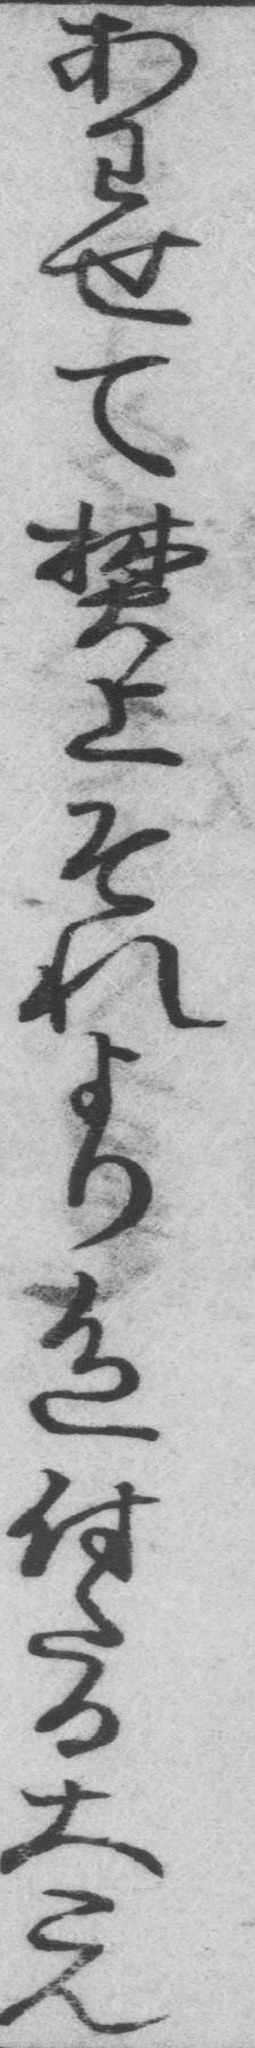あわせて焚上それより色付たる大こん
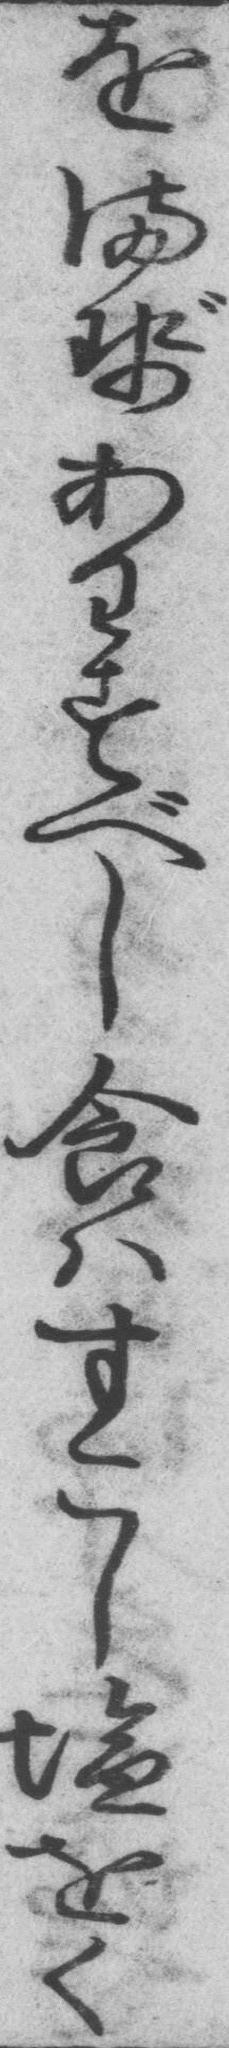を満ぜあわ春べし食はすこし塩をく
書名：料理伊呂波庖丁
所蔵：大阪府立大学学術情報センター 国文学研究資料館
